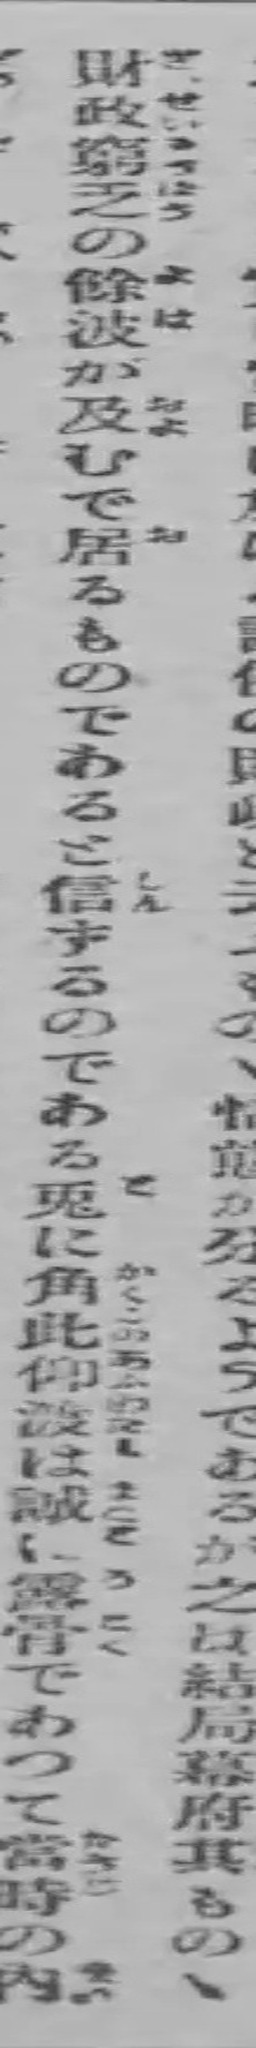財政窮乏の余波が及むで居るものであると信ずるのである兎に角此仰渡は誠に露骨であつて当時の内
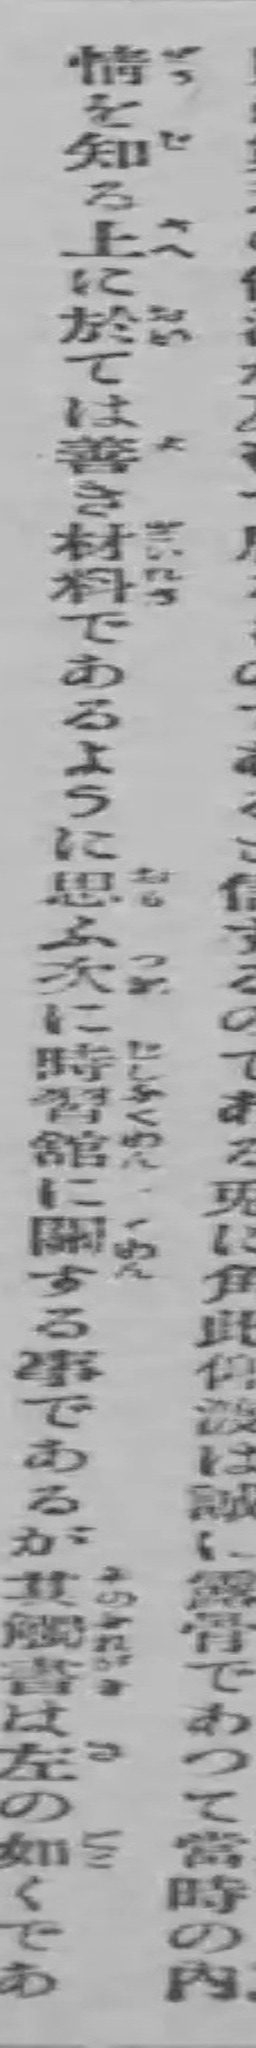情を知る上に於ては善材料であるように思ふ次に時習館に関する事であるが其触書は左の如くであ
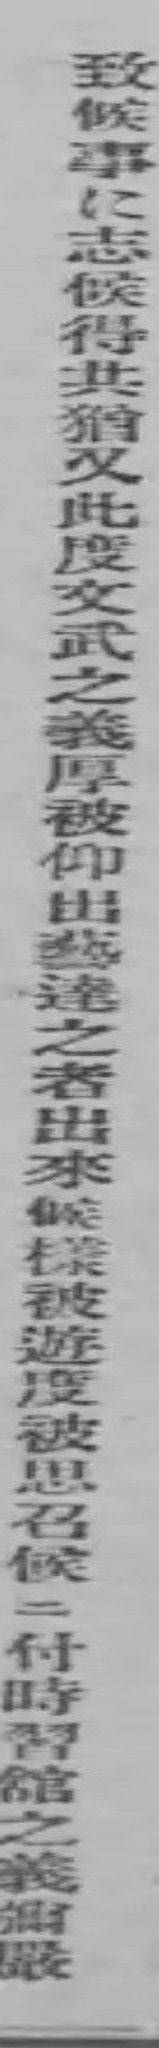致候事に志候得共猶又此度文武之義厚被仰出芸達之者出来候様被遊度被思召候ニ付時習館之義弥厳
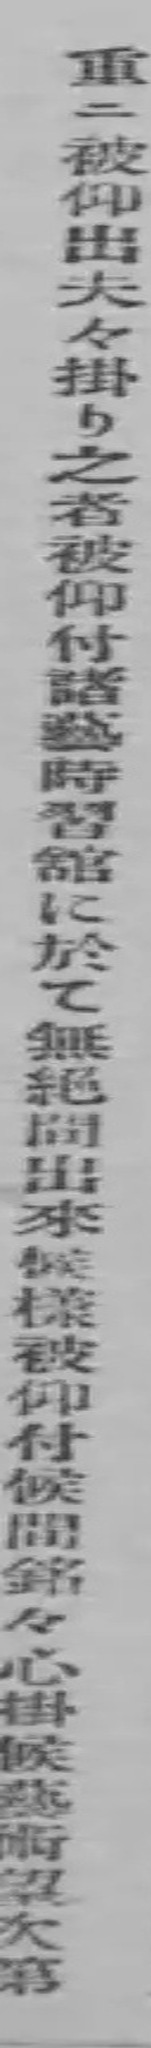重ニ被仰出夫々掛り之者被仰付諸芸時習館に於て無絶間出来候様被仰付候間銘々心掛候芸術望次第
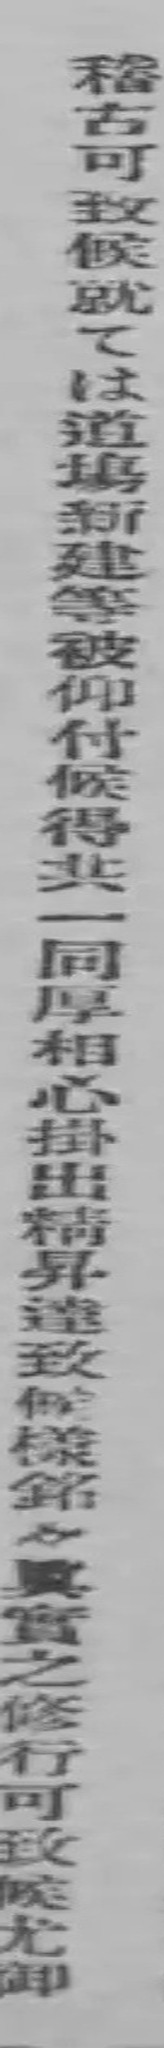稽古可致候就ては道場新建等被仰付候得共一同厚相心掛出精昇達致候様銘々真実之修行可致候尤御
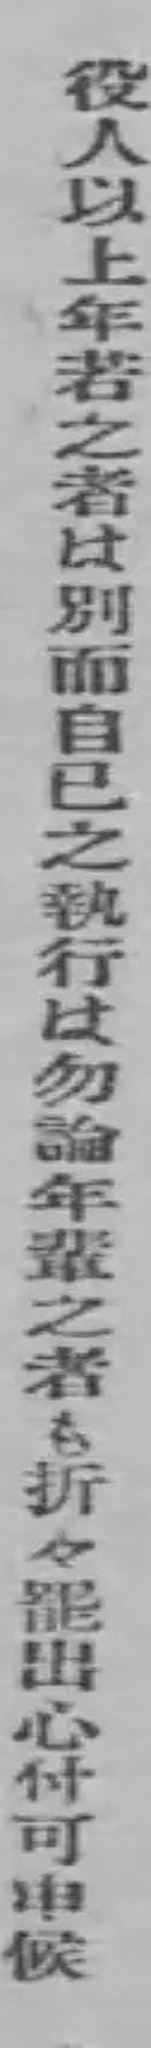役人以上年若之者は別而自己之執行は勿論年輩之者も折々罷出心付可申候
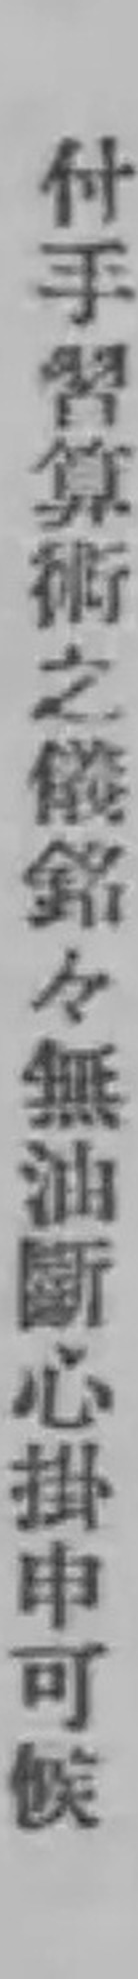付手習算術之儀銘々無油断心掛申可候
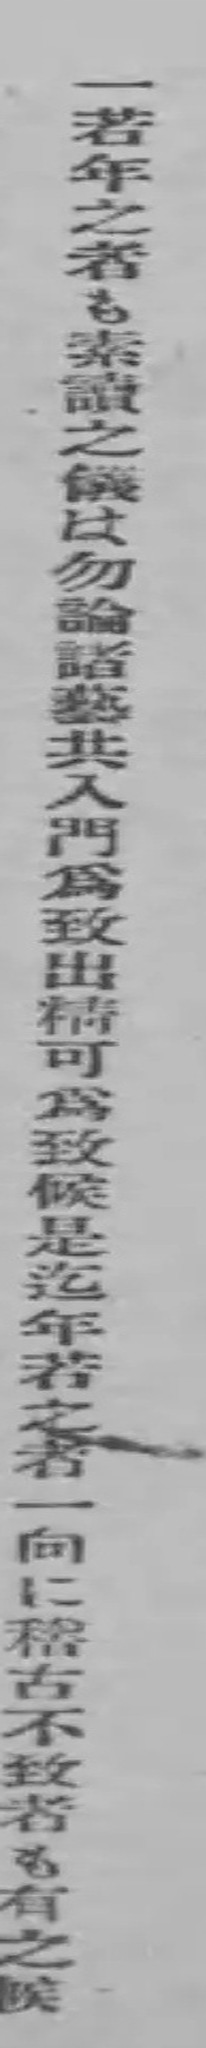一若年之者も素読之儀は勿論諸芸共入門為致出精可為致候是迄年若者一向に稽古不致者も有之候
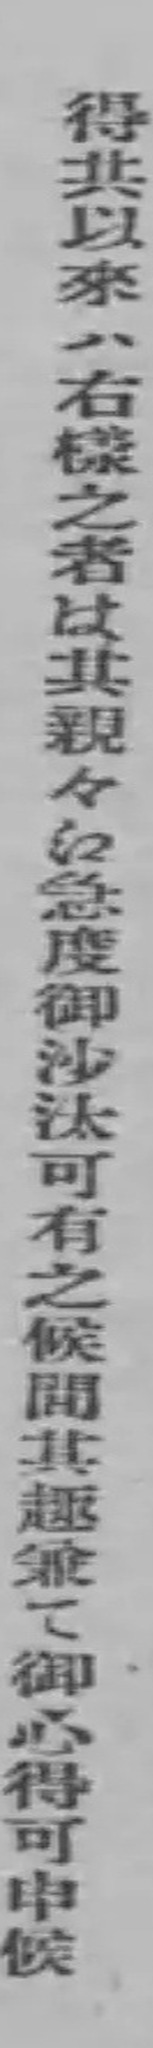得共以来ハ右様之者は其親々え急度御沙汰可有之候間其趣兼て御心得可申候
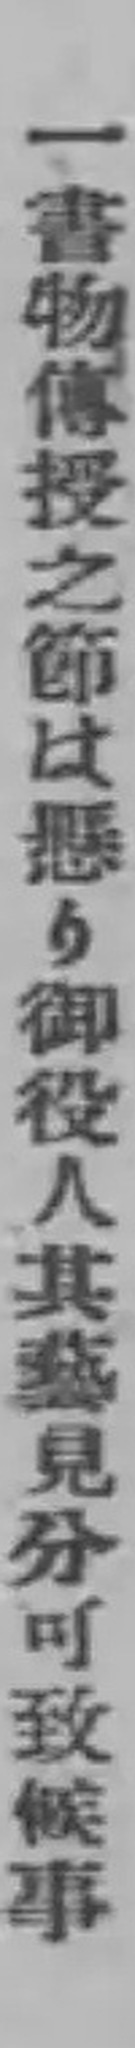一書物伝授之節は懸り御役人其芸見分可致候事
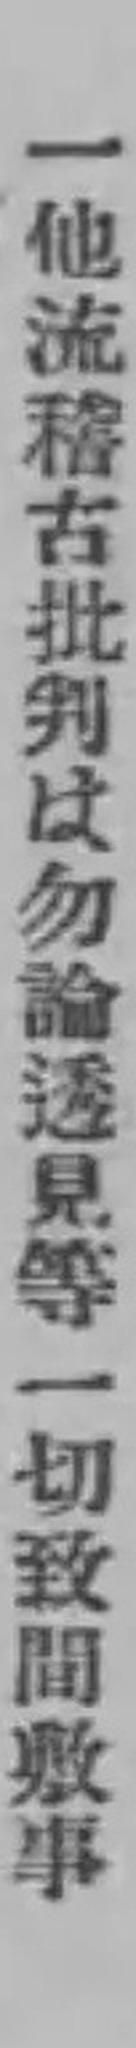一他流稽古批判は勿論透見等一切致間敷事
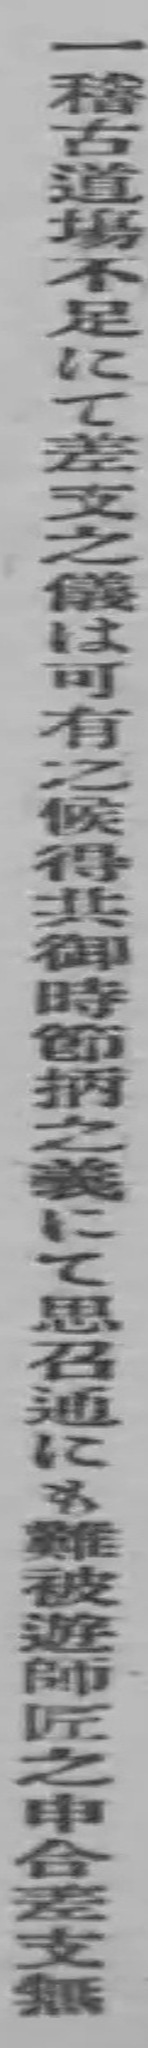一稽古道場不足にて差支之儀は可有之候得共御時節柄之義にて思召通にも難被遊師匠之申合差支無
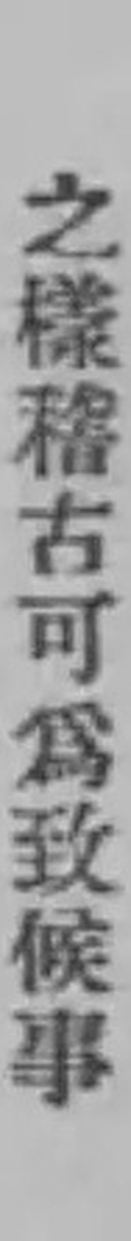之様稽古可為致候事
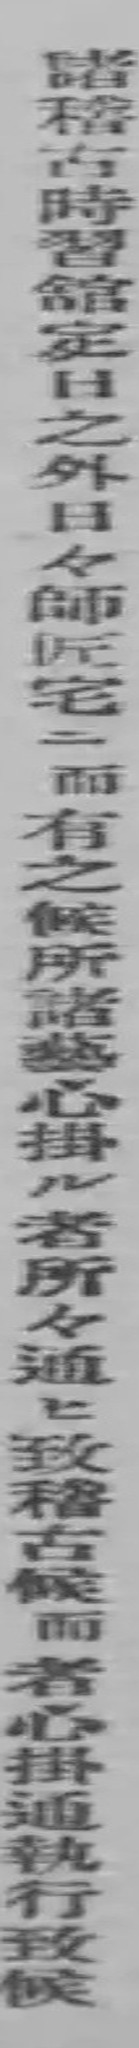諸稽古時習館定日之外日々師匠宅ニ而有之候所諸芸心掛ル者所々通ヒ致稽古候而者心掛通執行致候
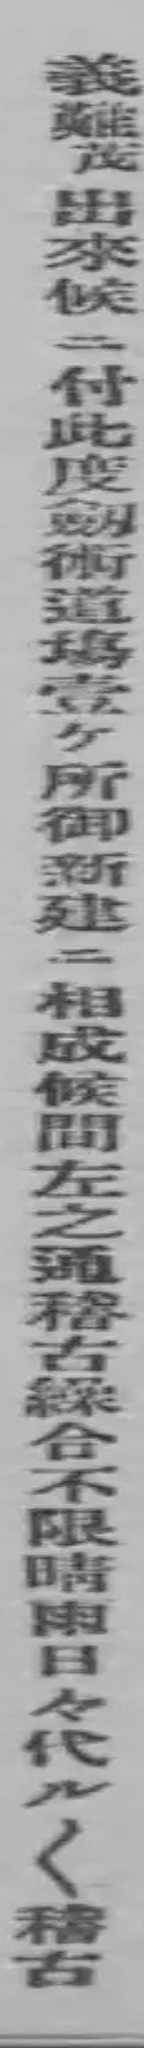義難茂出来候ニ付此度釼術道場壱ケ所御新建ニ相成候間左之通稽古繰合不限晴雨日々代ル〳〵稽古
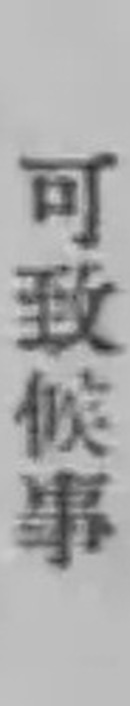可致候事
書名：豊橋市史談
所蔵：国立国会図書館 National Diet Library, JAPAN
